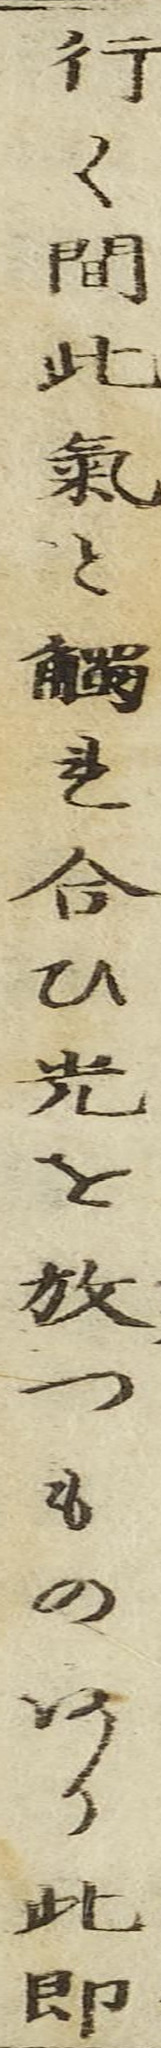行く間此気と触れ合ひ光を放つものあり此即

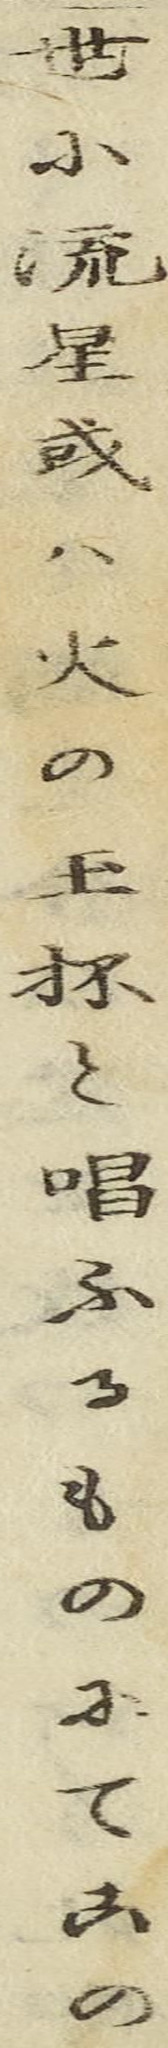世に流星或は火の玉抔と唱ふるものにてこの
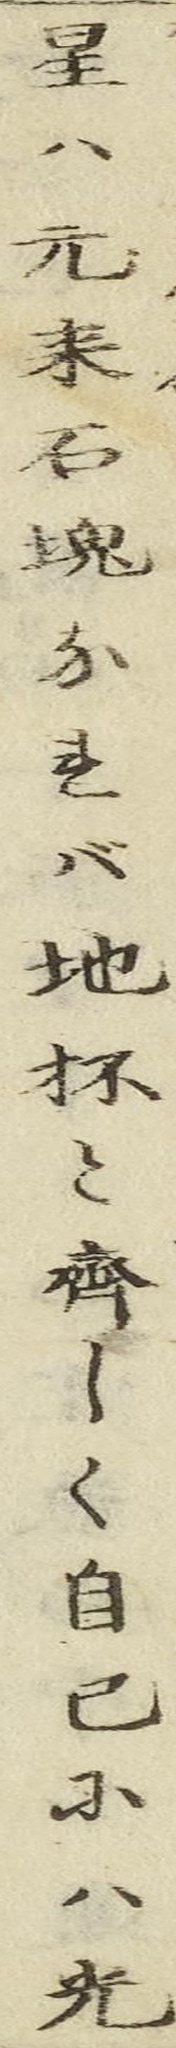星は元来石塊なれば地抔と斉しく自己には光
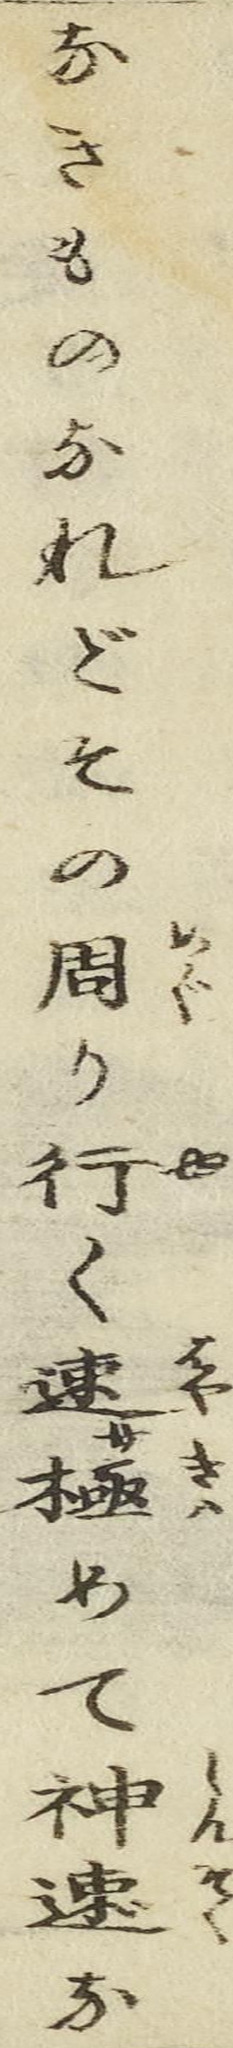なきものなれどその周り行く速さ極めて神速な
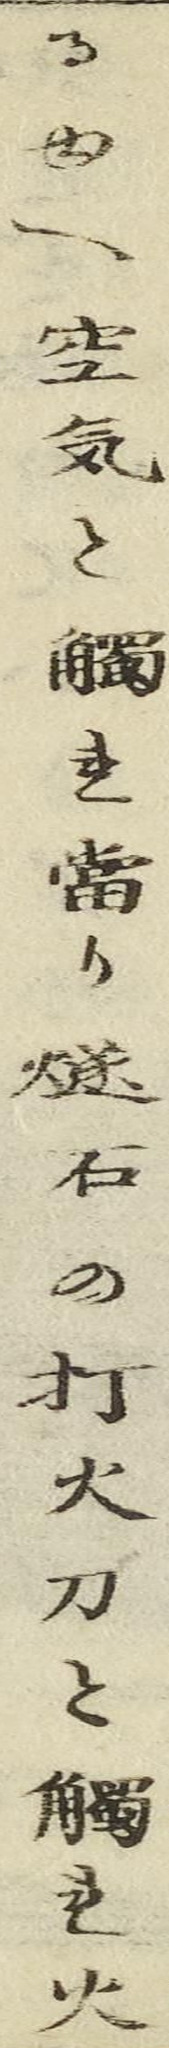るゆへ空気と触れ当り燧石の打火刀と触れ火
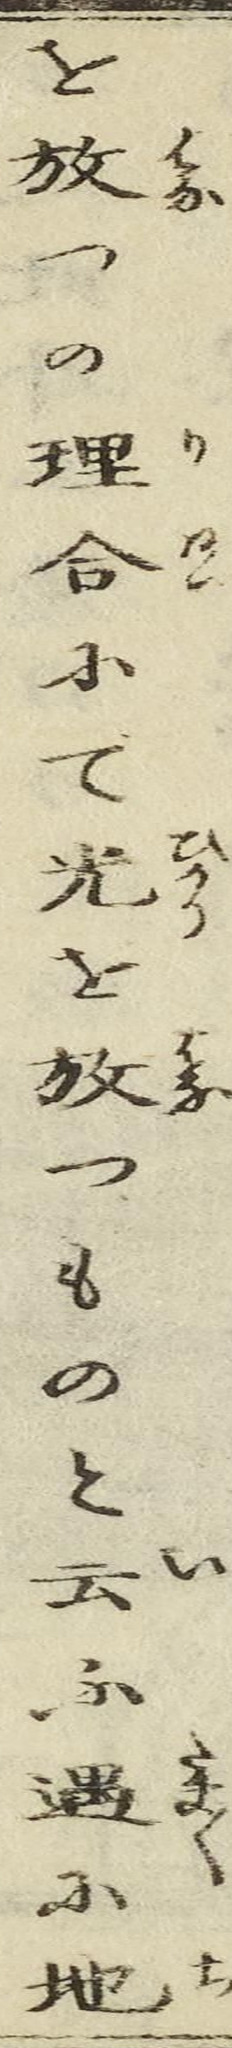を放つの理合にて光を放つものと云ふ偶に地
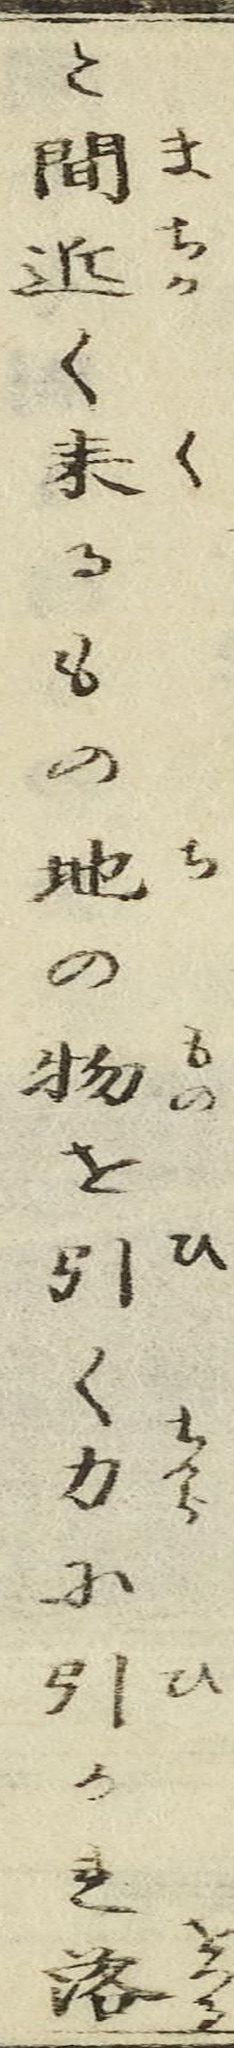と間近く来るもの地の物を引く力に引かれ落
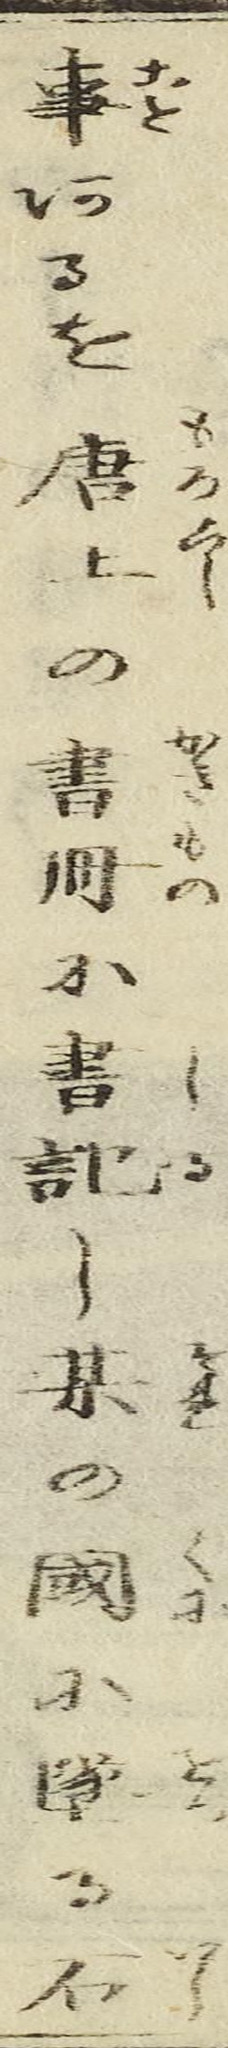事あるを唐土の書冊に書記し某の国に墜る石
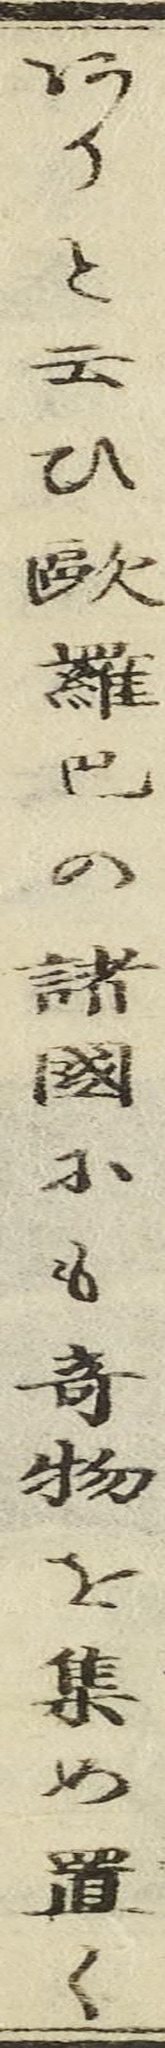ありと云ひ欧羅巴の諸国にも奇物を集め置く
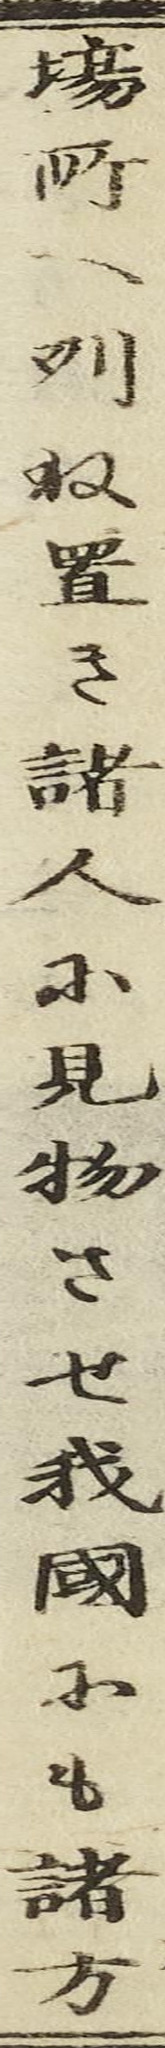場所へ列ね置き諸人に見物させ我国にも諸方
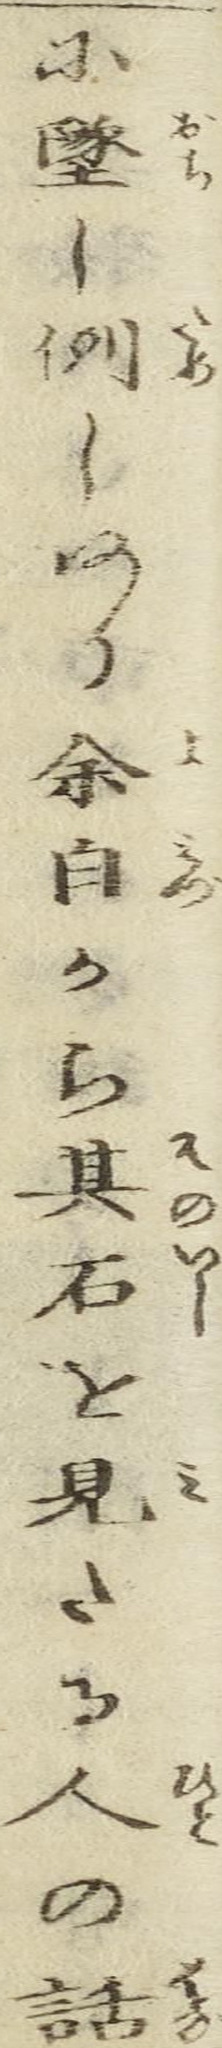に墜し例しあり余自から其石を見たる人の話
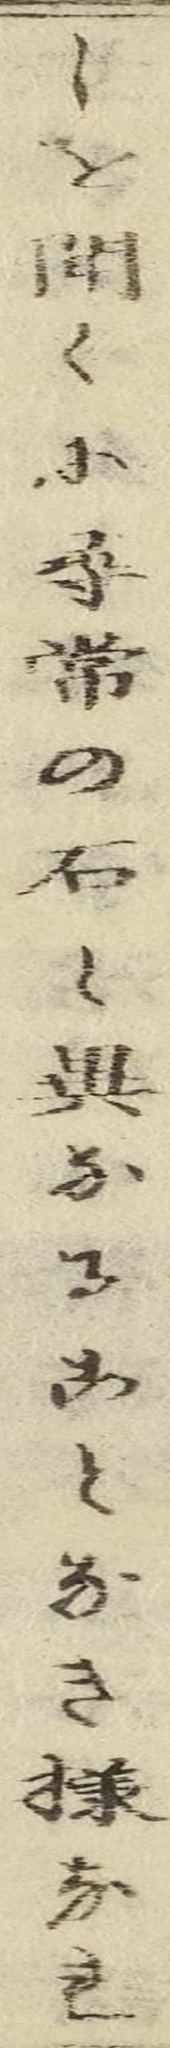しを聞くに尋常の石と異なることなき様なれ
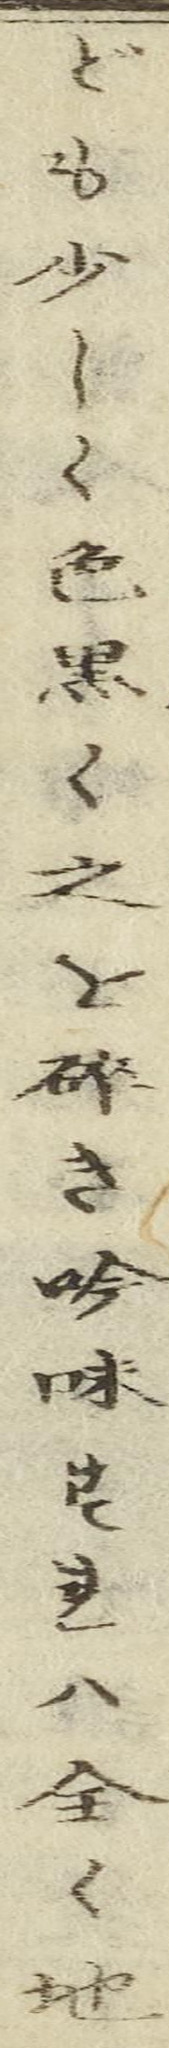ども少しく色黒く之を砕き吟味すれは全く地
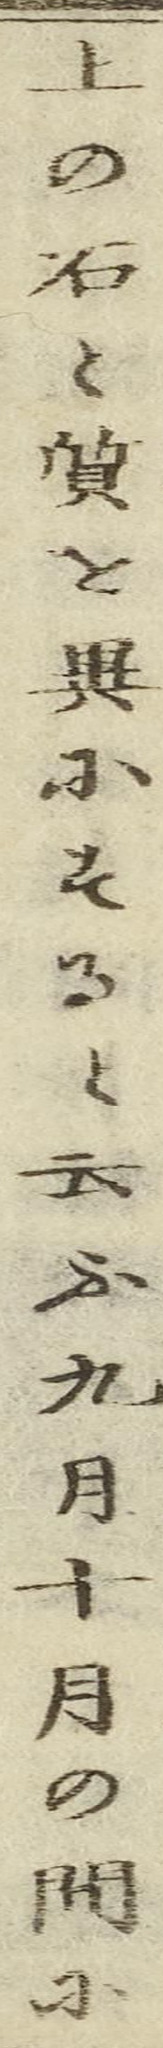上の石と質を異にすると云ふ九月十月の間に
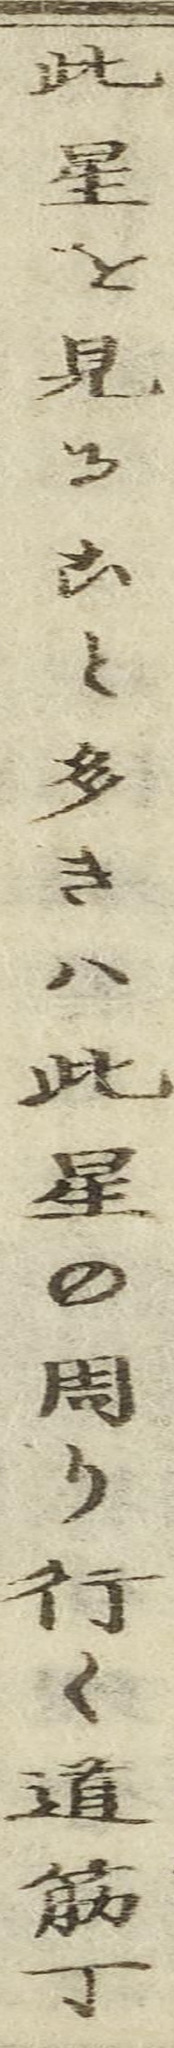此星を見ること多きは此星の周り行く道筋丁
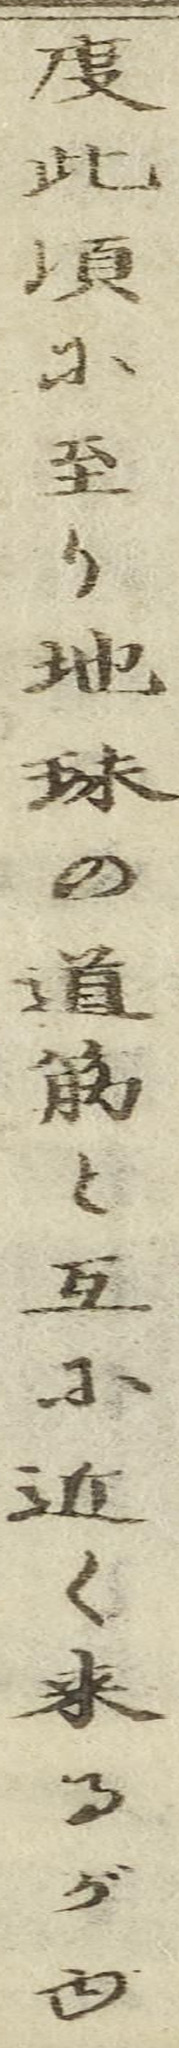度此頃に至り地球の道筋と互に近く来るがゆ
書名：天変地異
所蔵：東京大学地震研究所図書室 Earthquake Research Institute Library, The University of Tokyo, JAPAN
